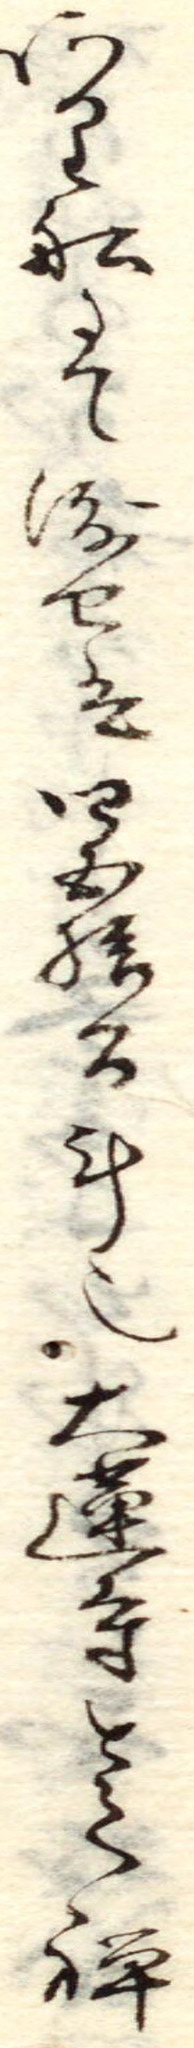あり船にて渡せは四五拾間斗也大蓮寺とて禅
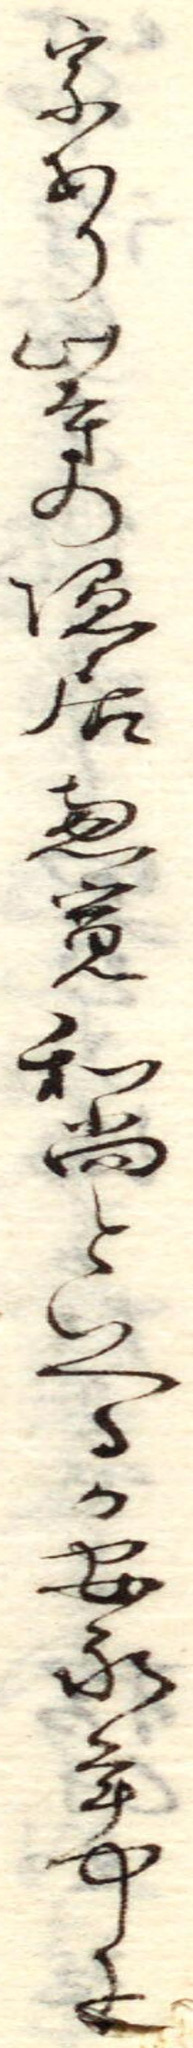宗あり此寺の隠居恵寛和尚といへるか安永年中近
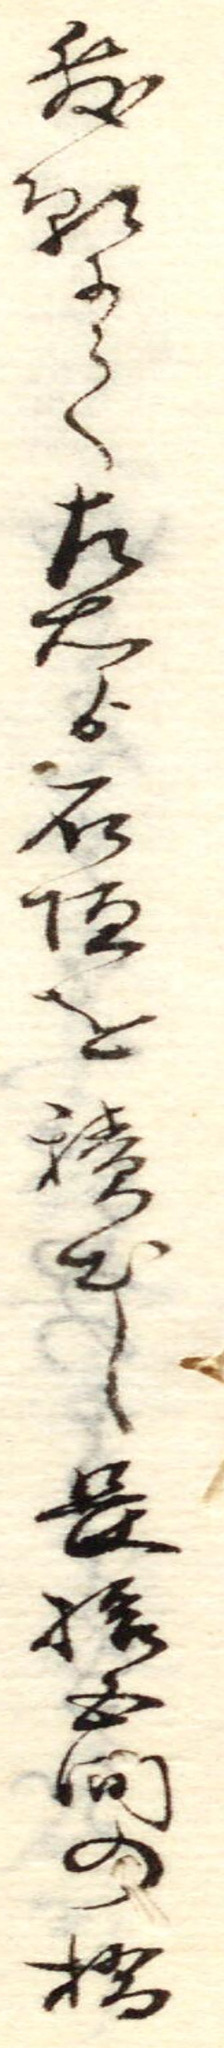発願にて左右ゟ石垣を積出し長拾五間の橋
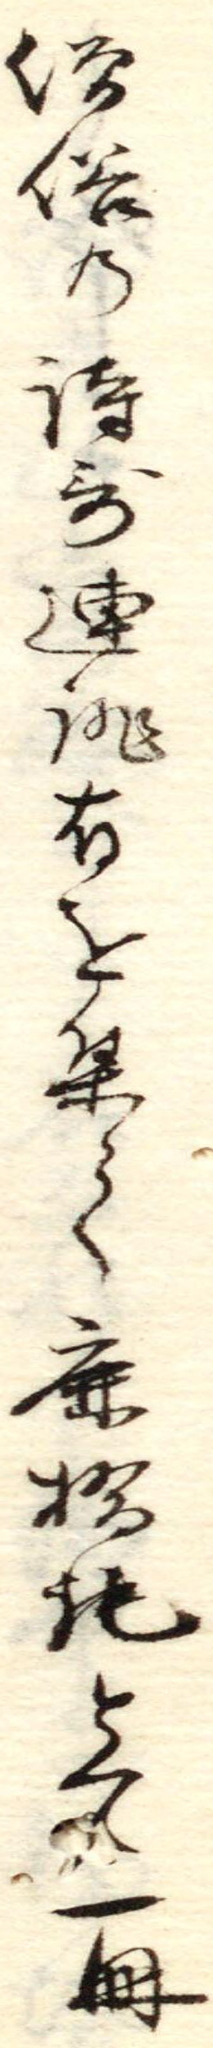僧俗の詩哥連俳有を集て鹿橋記とて一冊
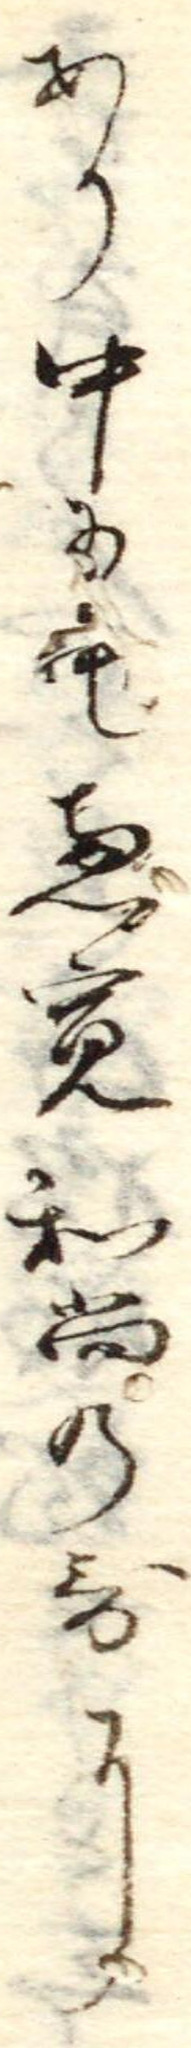あり中にも恵寛和尚の哥に
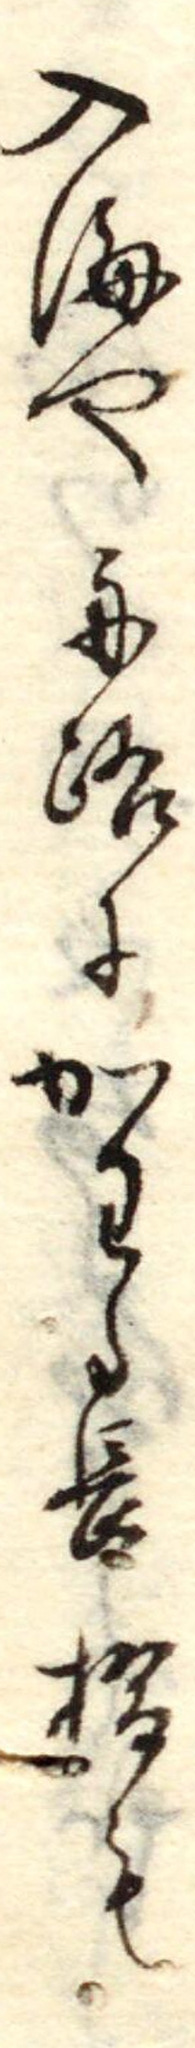入海や舟路にかわる長橋も

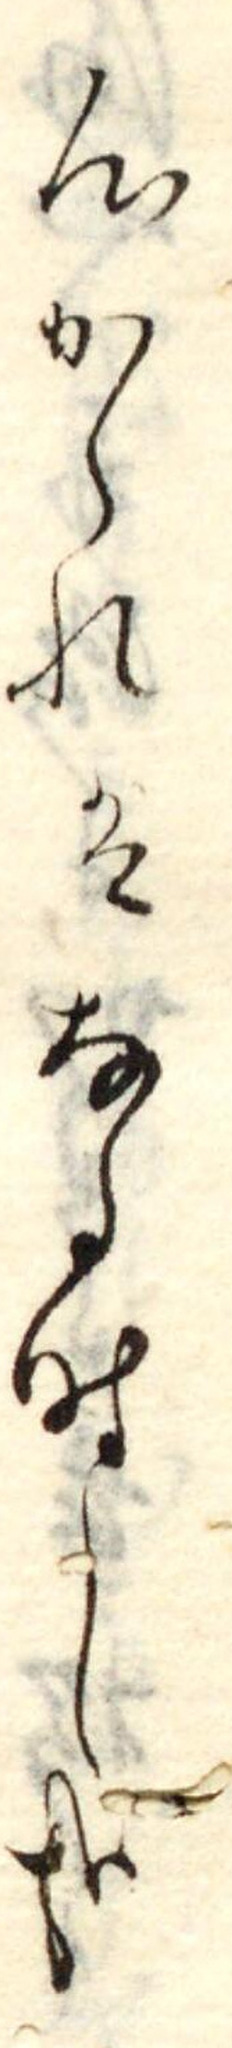心かくれはなる時し哉
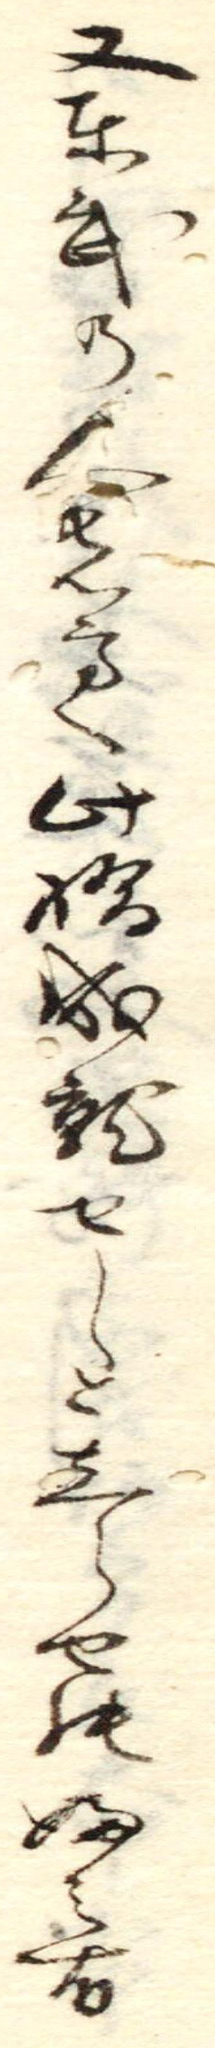又東武の人の方へ此橋成就せしとしらせのふみ有
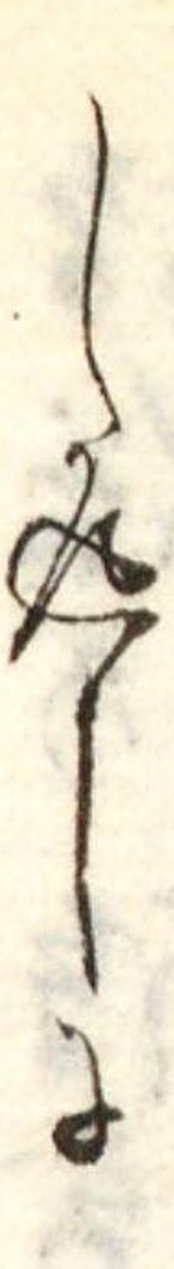し返しに
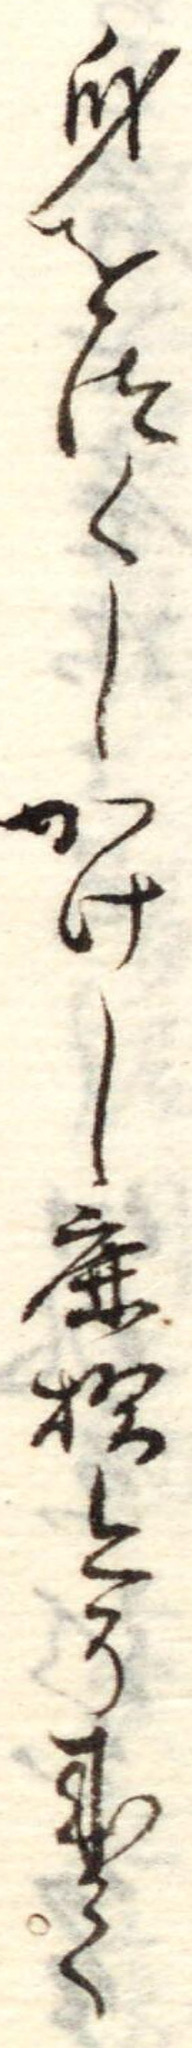身をつくしかけし鹿橋今そ来て
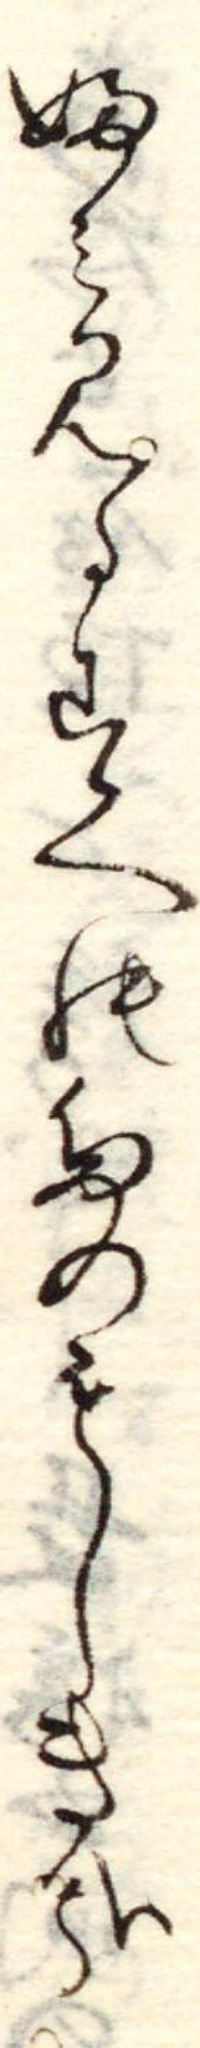ふみ見るすへのたのもしき哉
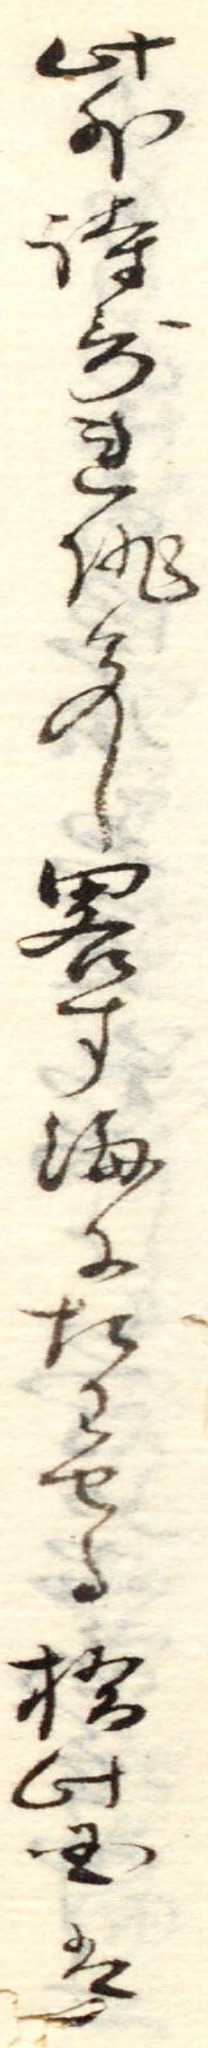此外詩哥連俳多し略す海にたわせる橋此国は
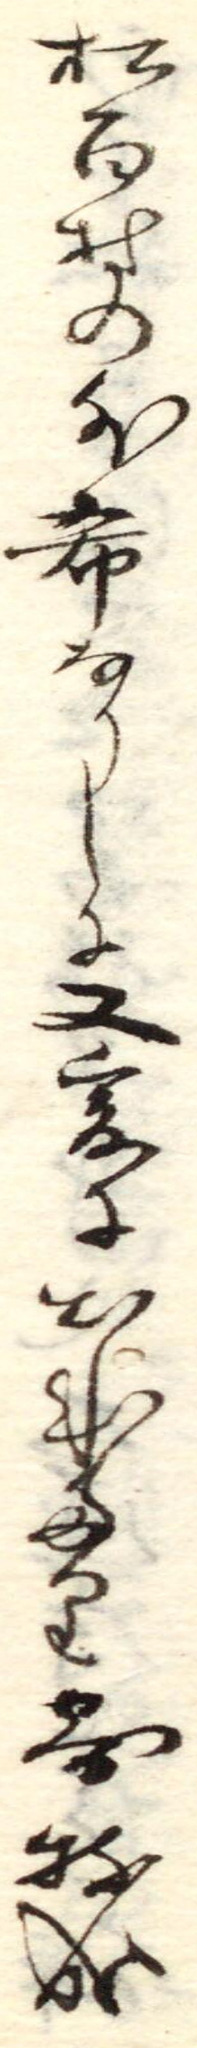松百村の外希なりしに又爰に出来たり寄特成
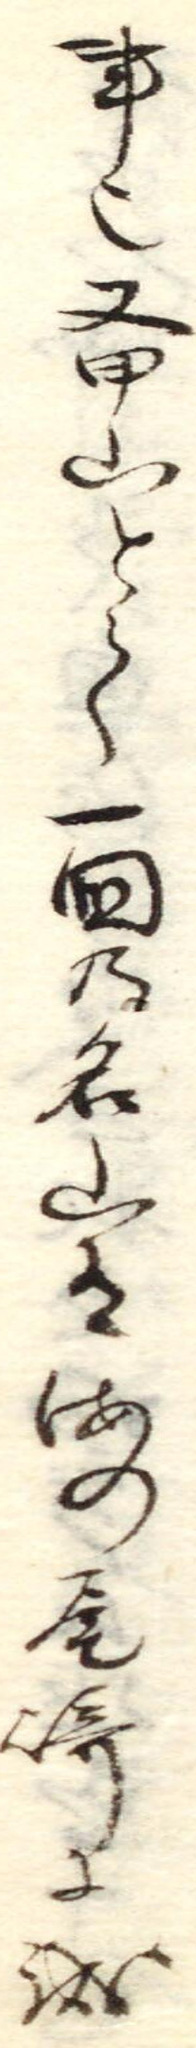事也又甲山とて一国の名山有海の尾崎に誠
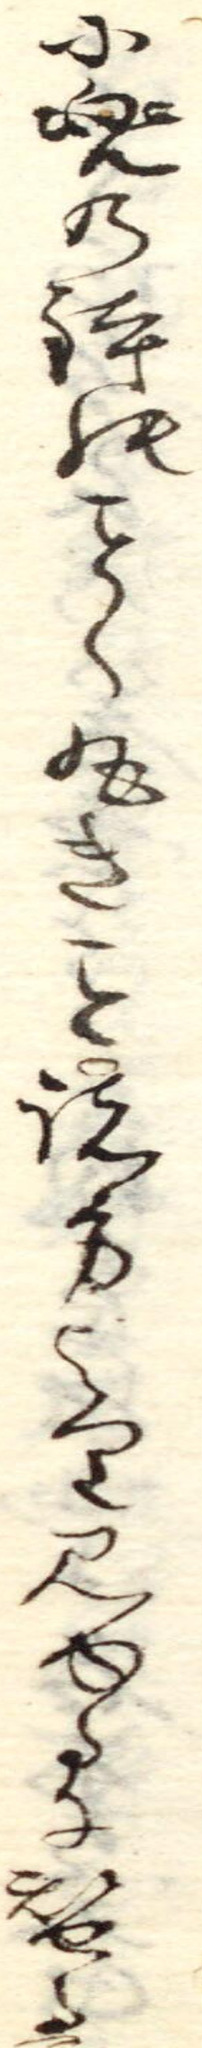に兜の鉢のことく丸きこと諸方より見ゆるに替る
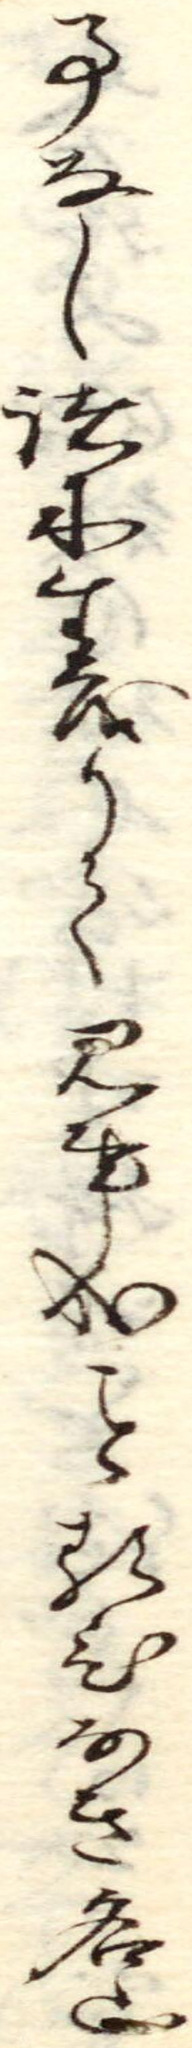事なし諸木生茂りて見事成こと類ひなき名山
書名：能登名跡誌
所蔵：Ishikawa Prefectural Library
